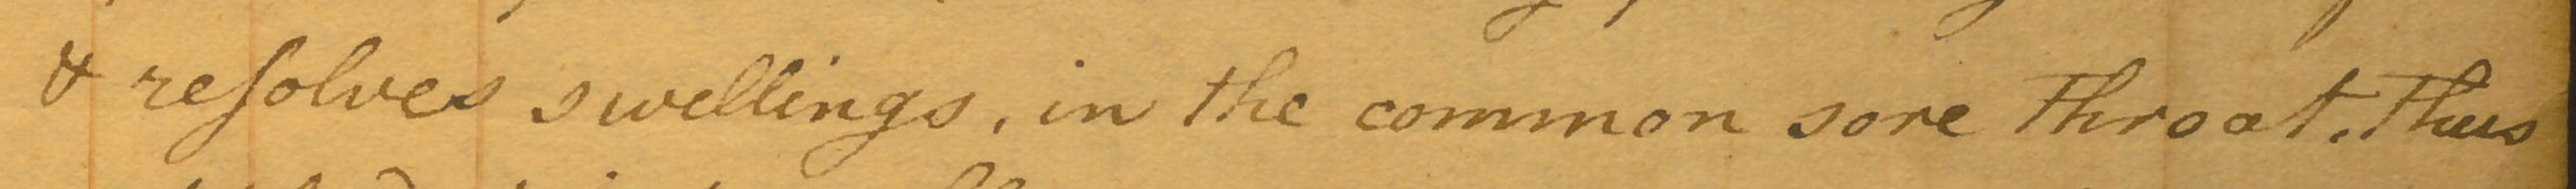& resolves swellings, in the common sort throat thus
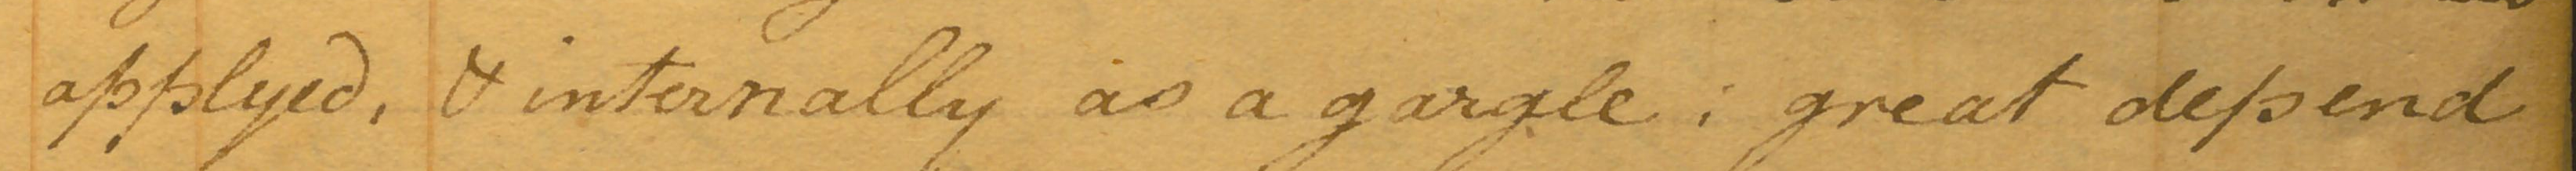applyed, & internally as a gargle; great depend
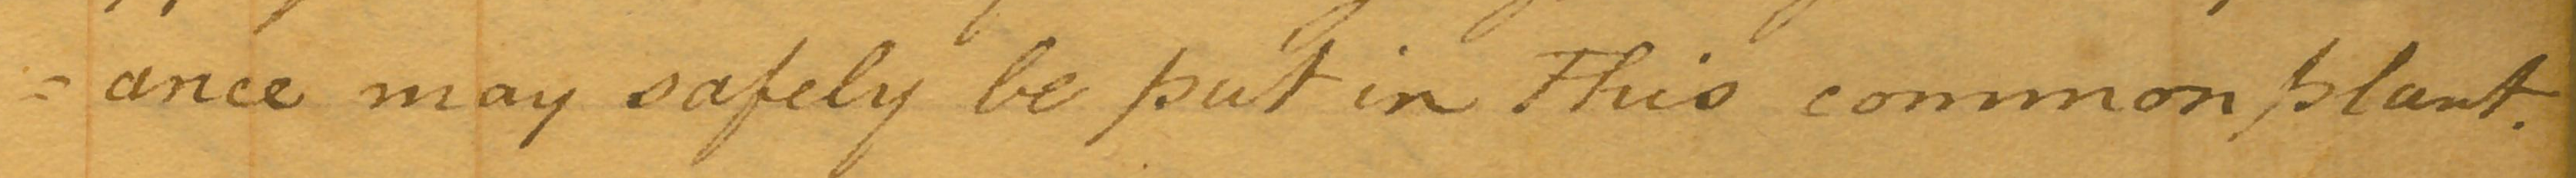-ance may safely be put in this common plant.
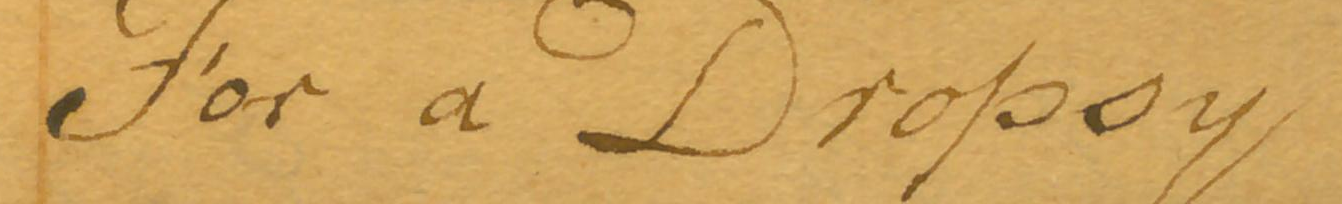For a Dropsy
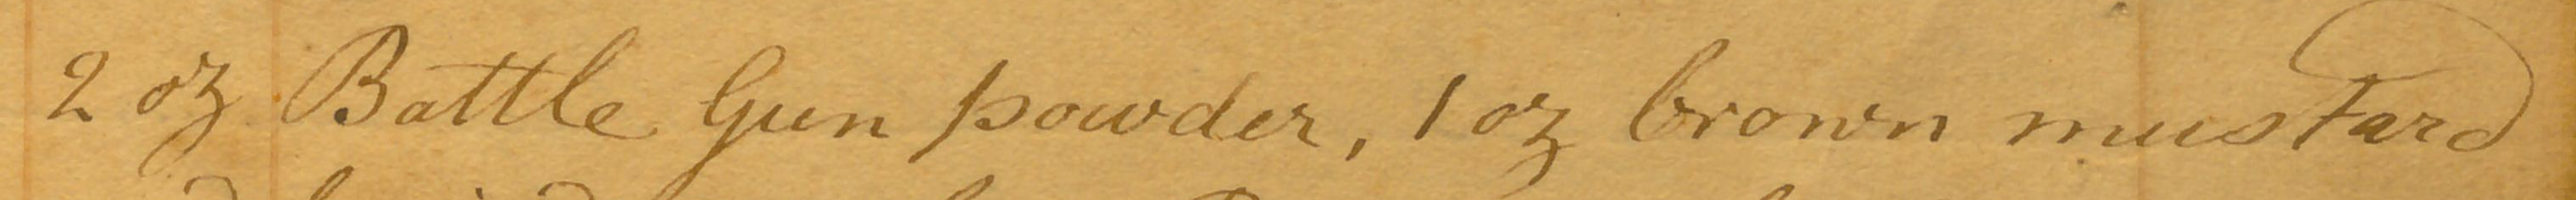2 oz Battle Gun powder, 1 oz brown mustard
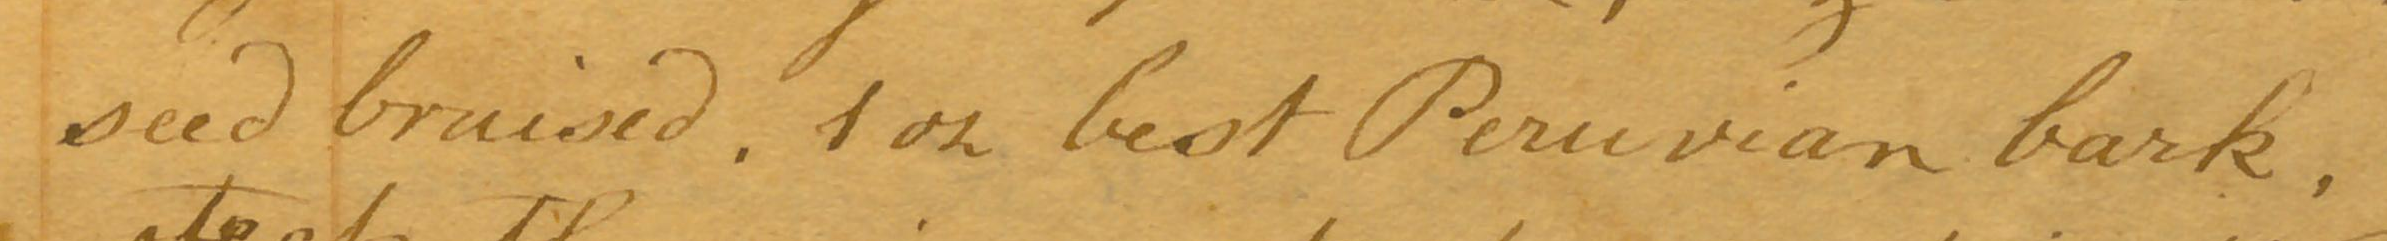seed bruised, 1 oz best Peruvian bark,
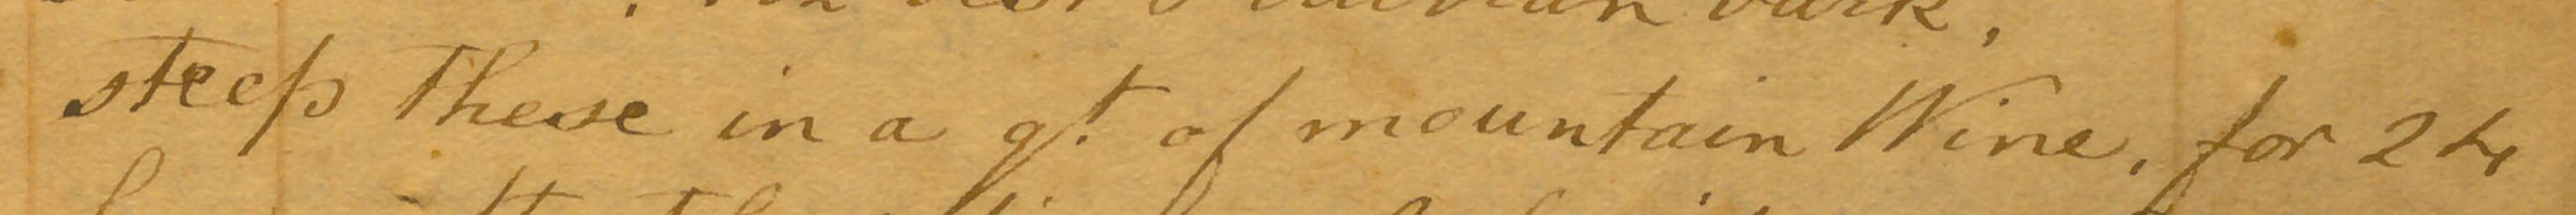steep these in a q^t. of mountain Wine, for 24
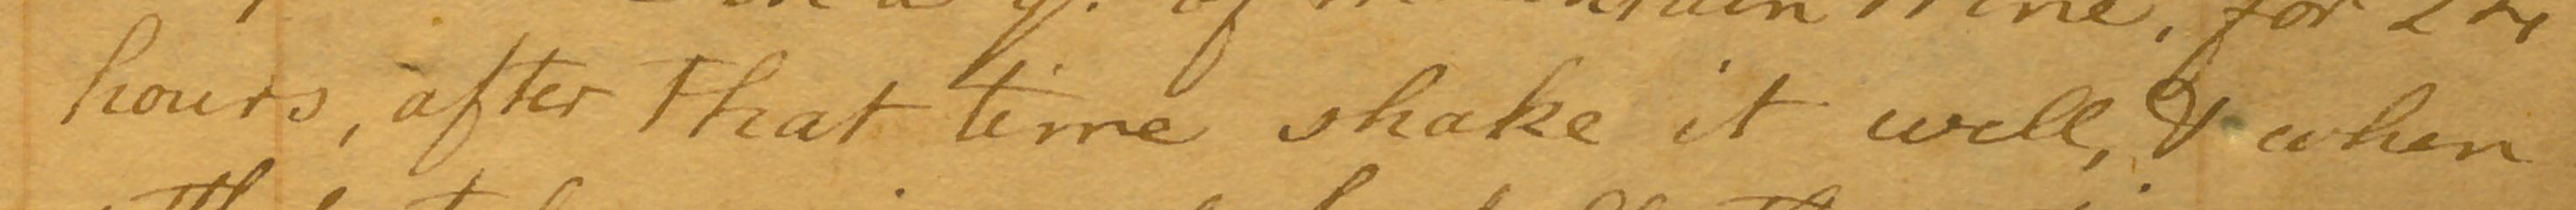hours, after that time shake it well, & when
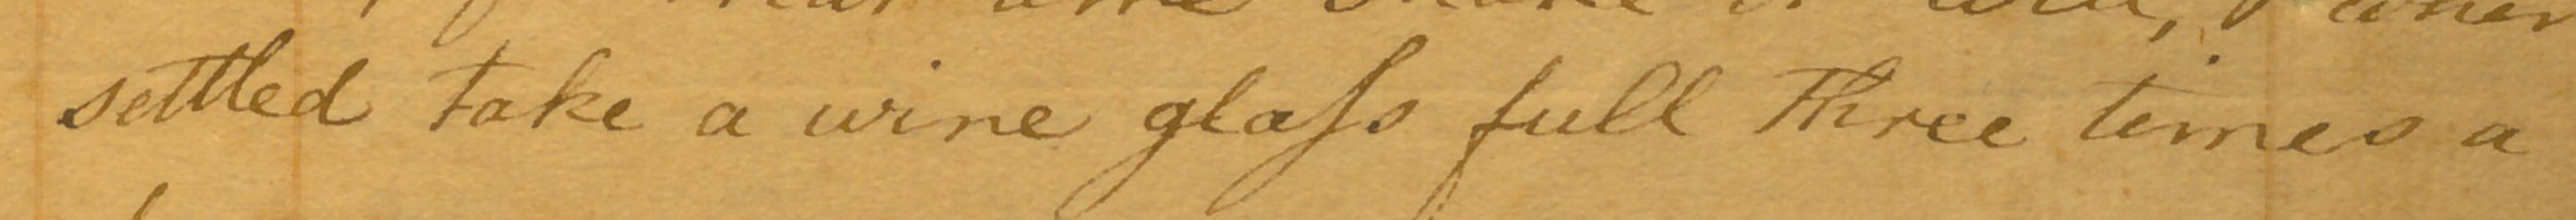settled take a wine glass full three times a
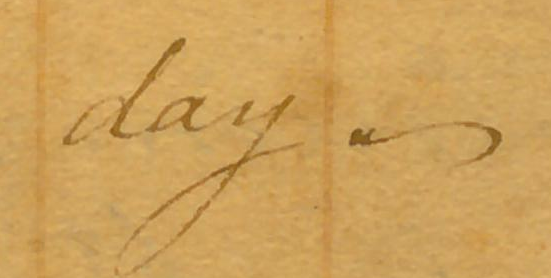day-
